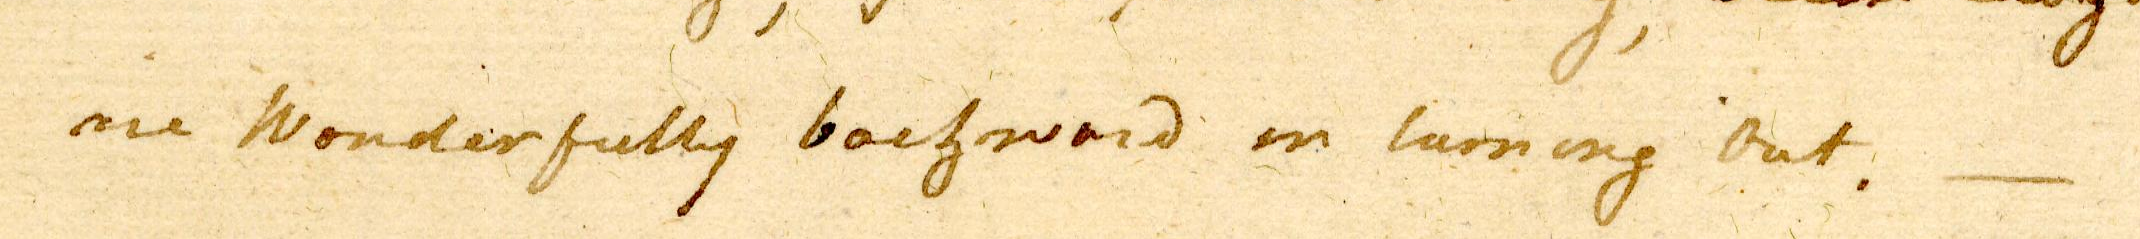are wonderfully backward in coming out
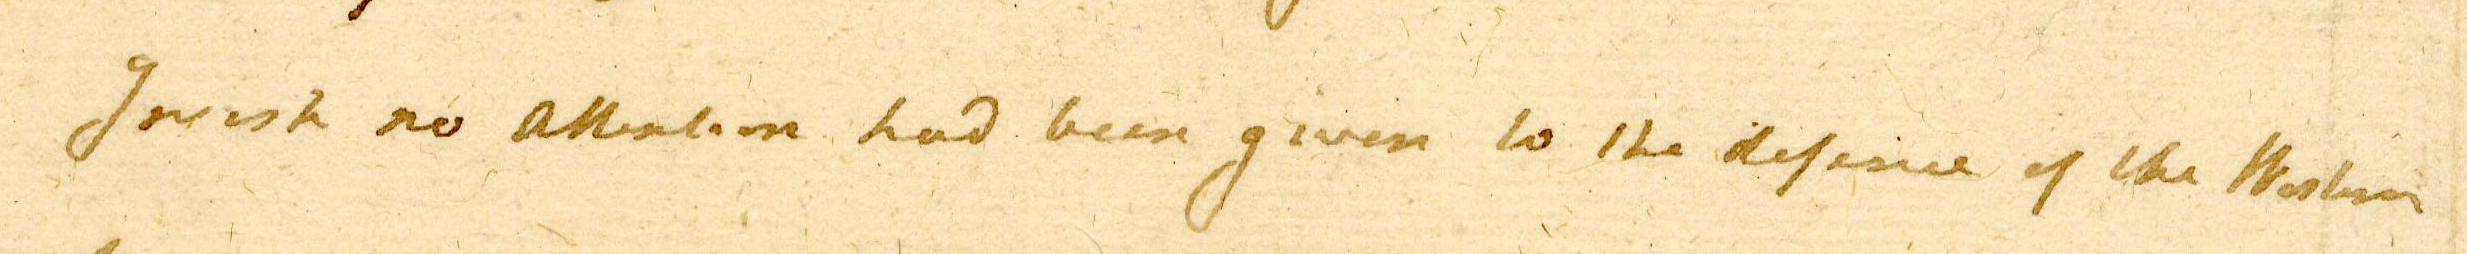I wish no attention had been given to the defense of the Washon
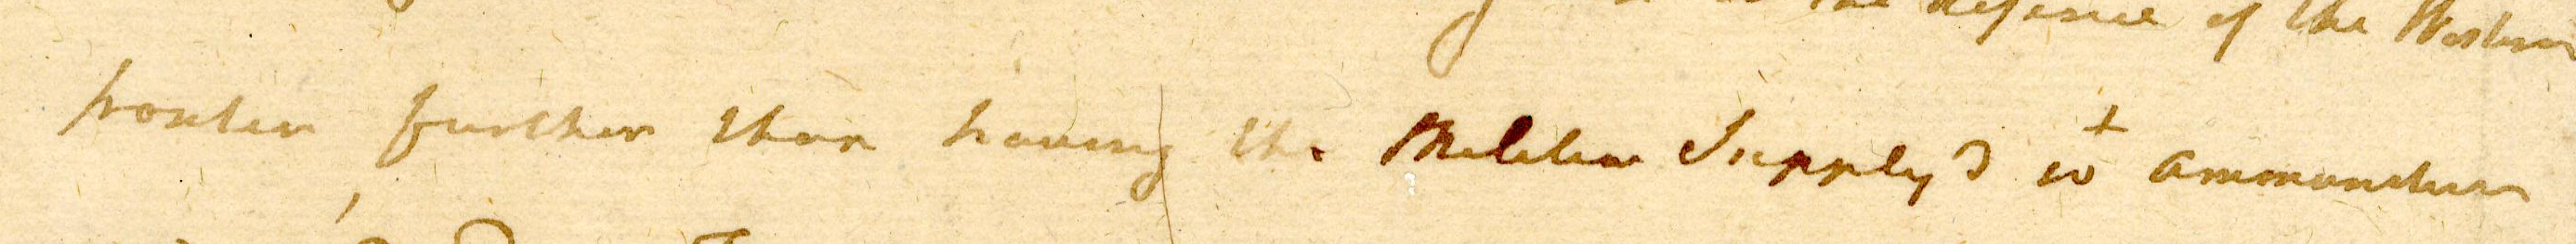frontier further that having the military Supplyd is ammendive
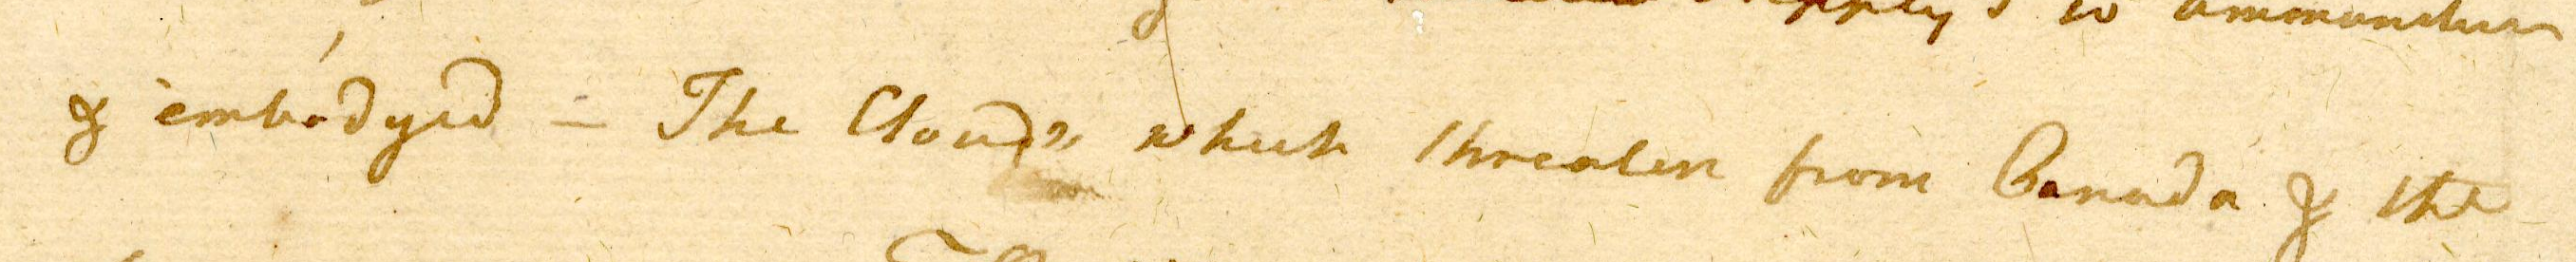& embodyed- The Clouds which threaten from Canada & the
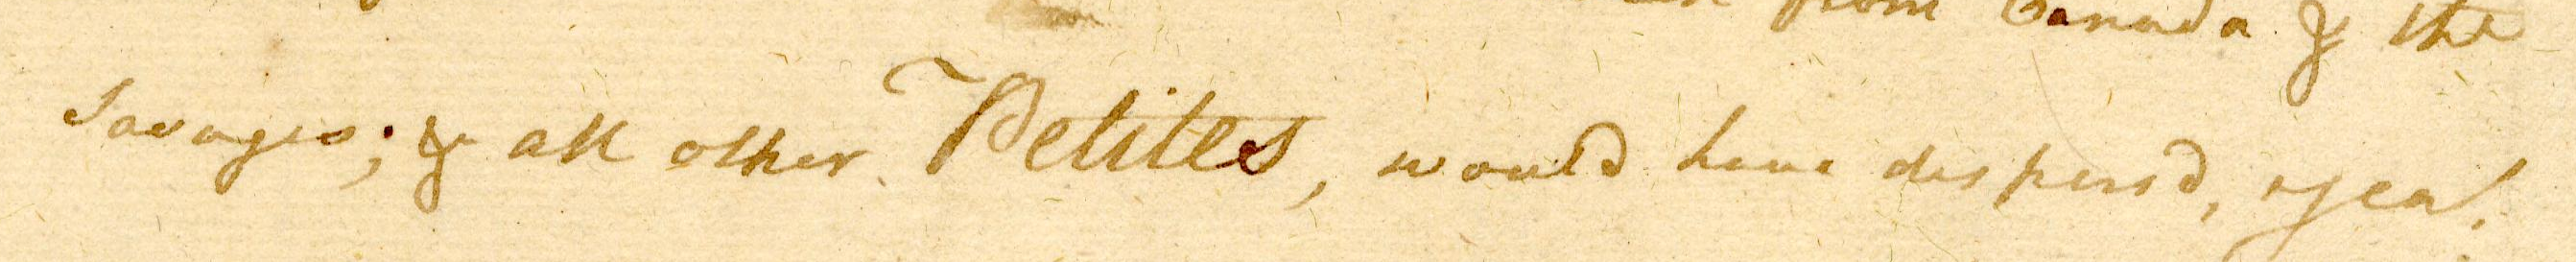Savages; & all other Petites, would have dispers'd yea.
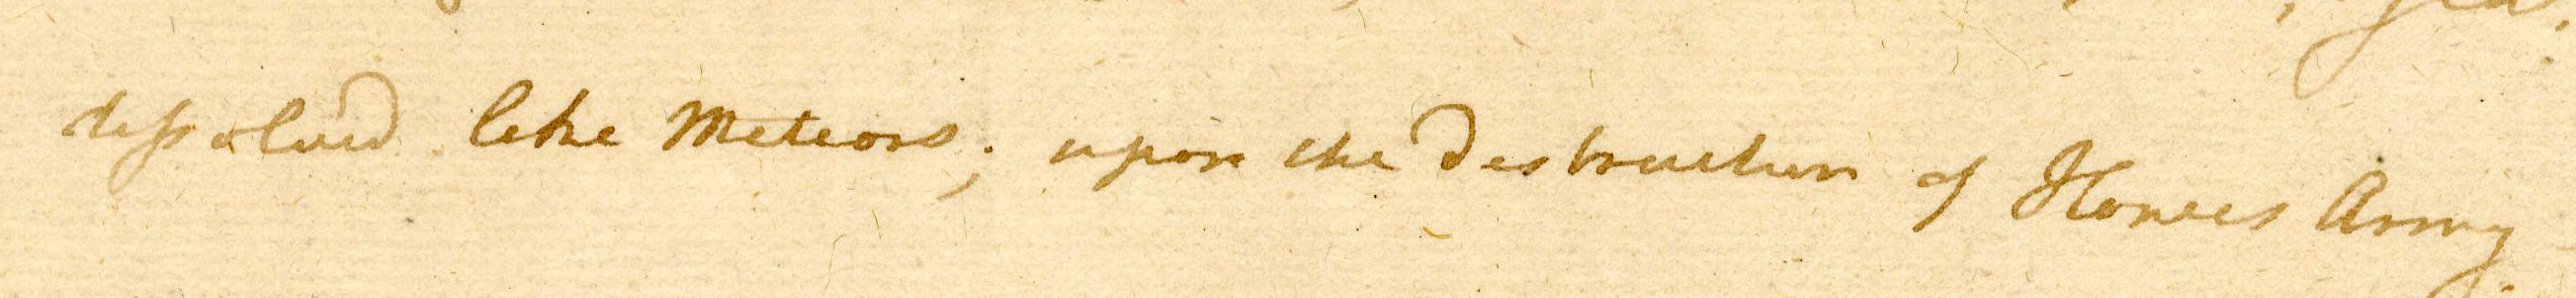dissolved lake Meteors; upon the destruction of Howes Army
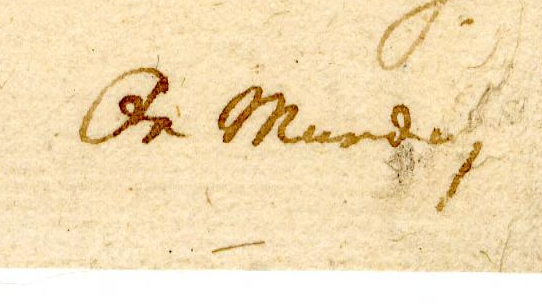On Monday
